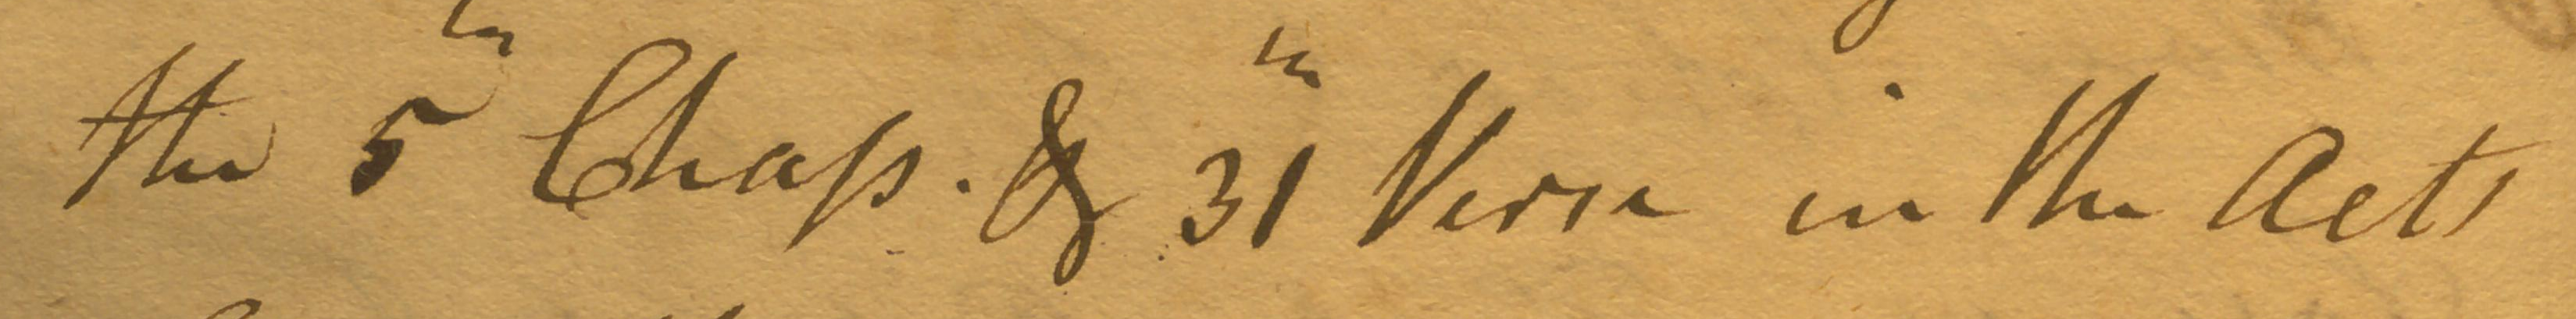the 5^th Chap. & 31^th Verse in the Acts
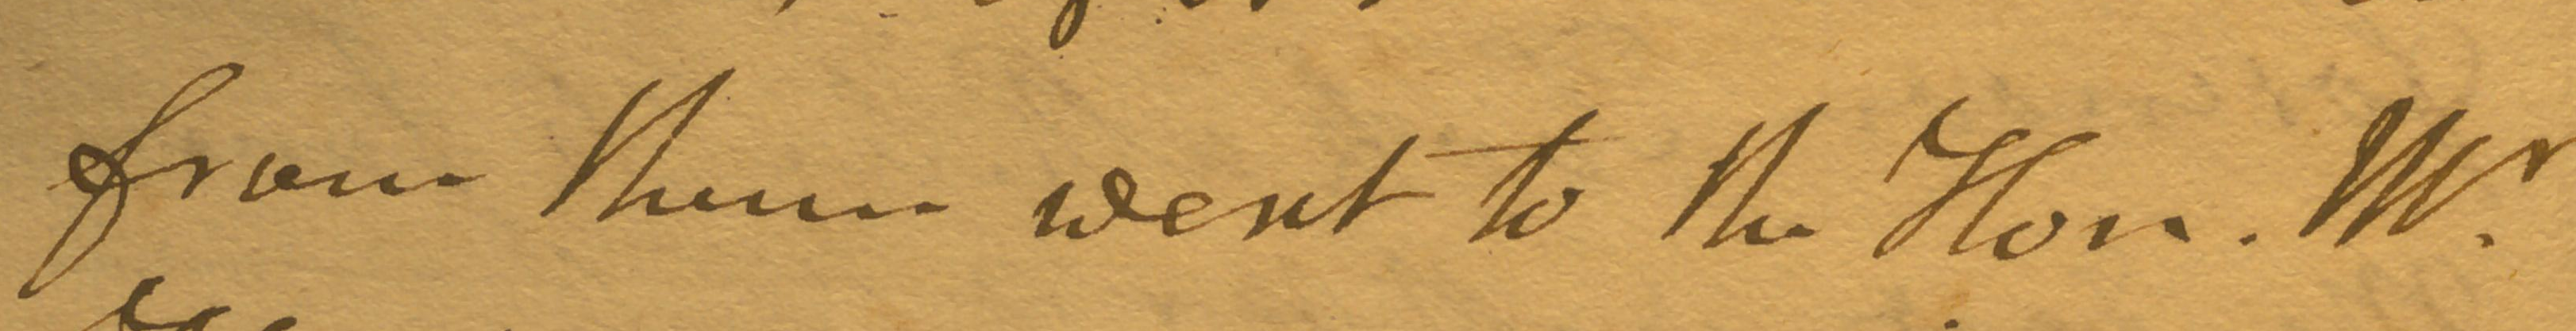from thence went to the Hon. M^r.
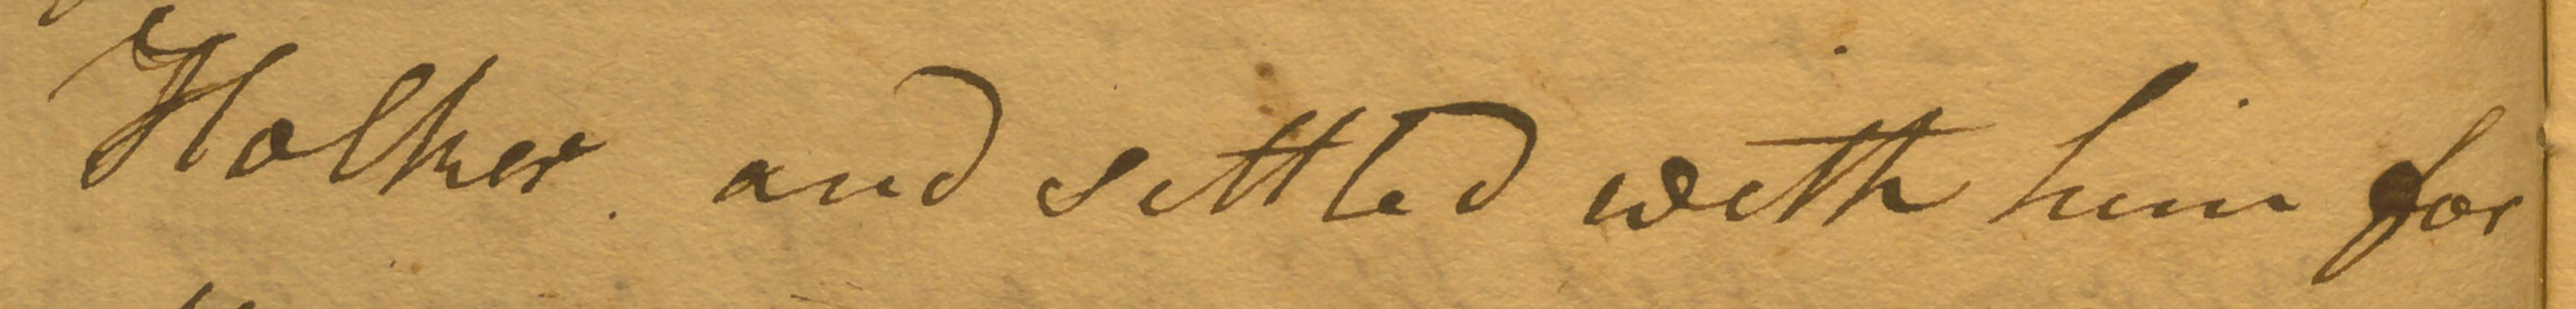Holker and settled with him for
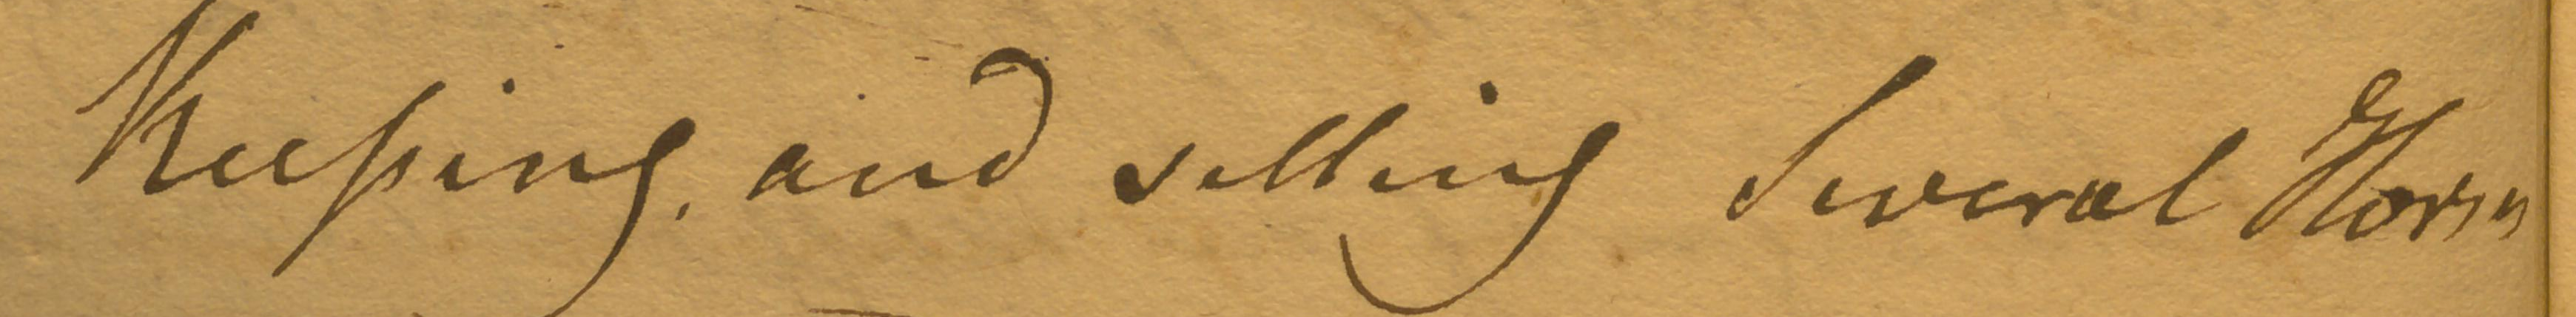Keeping and selling several Horses
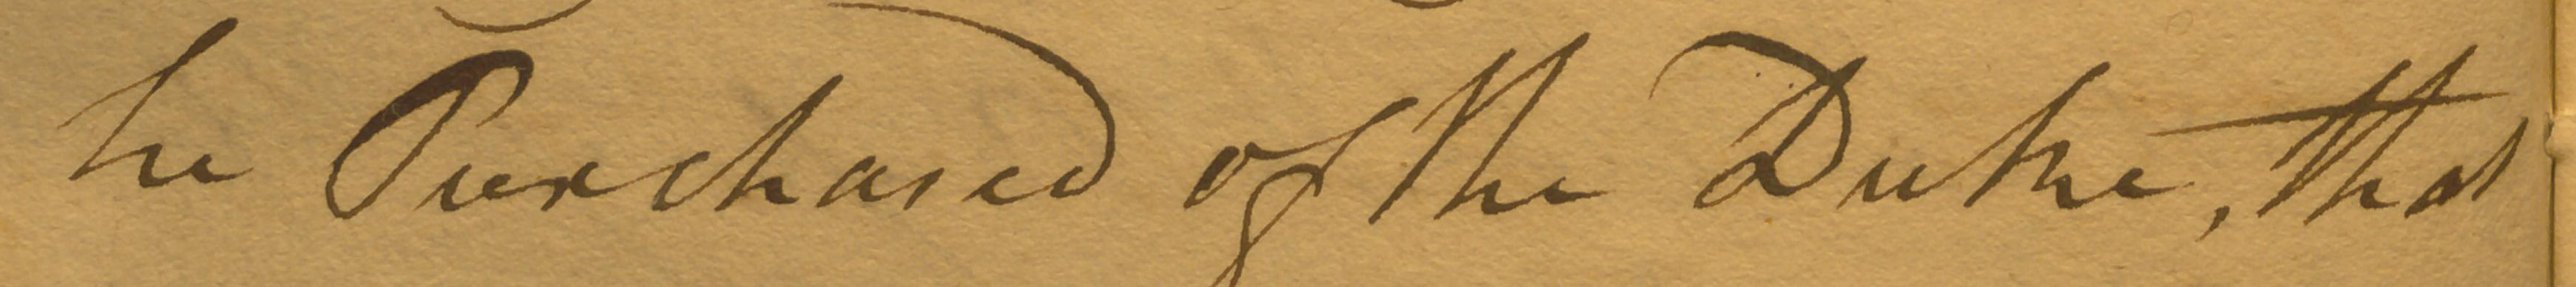he Purchased of the Duke, that
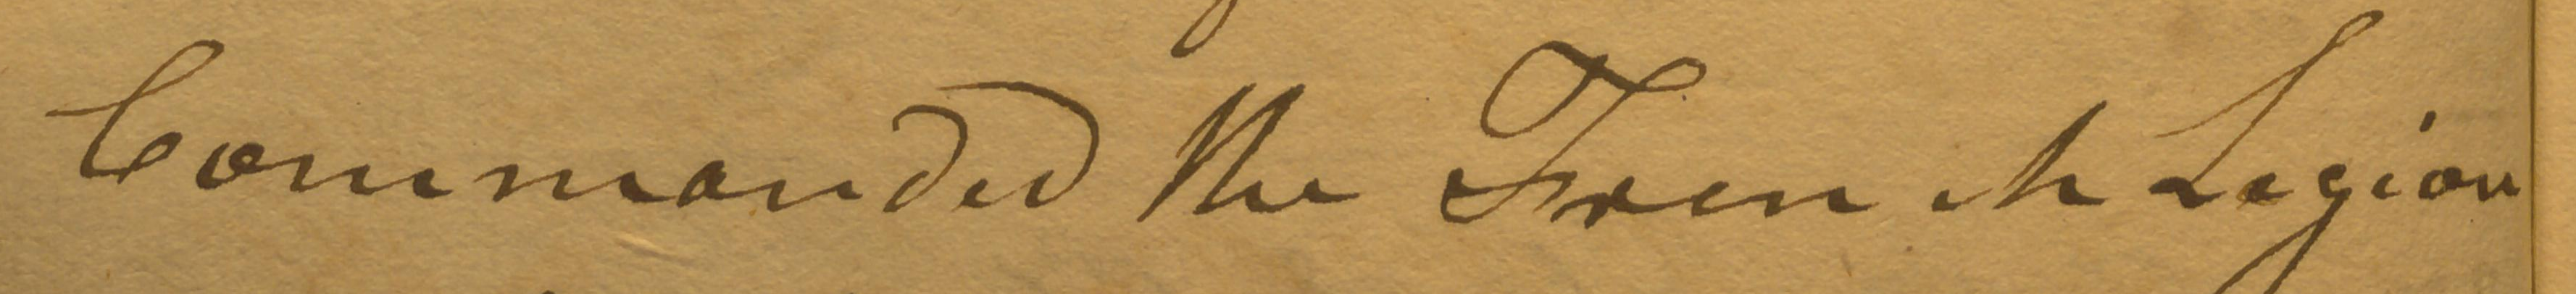Commanded the French Legion
